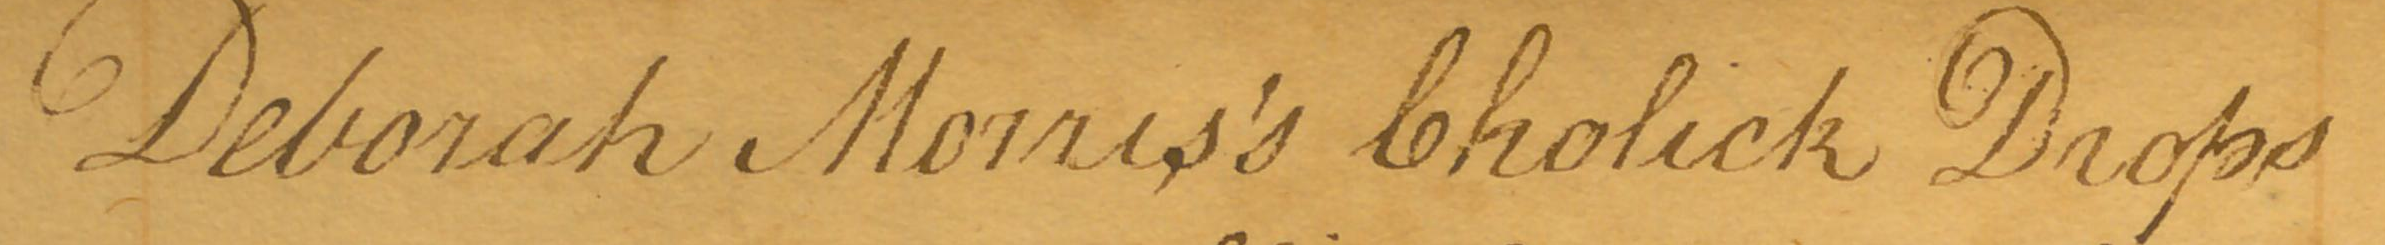Deborah Morris's Cholick Drops
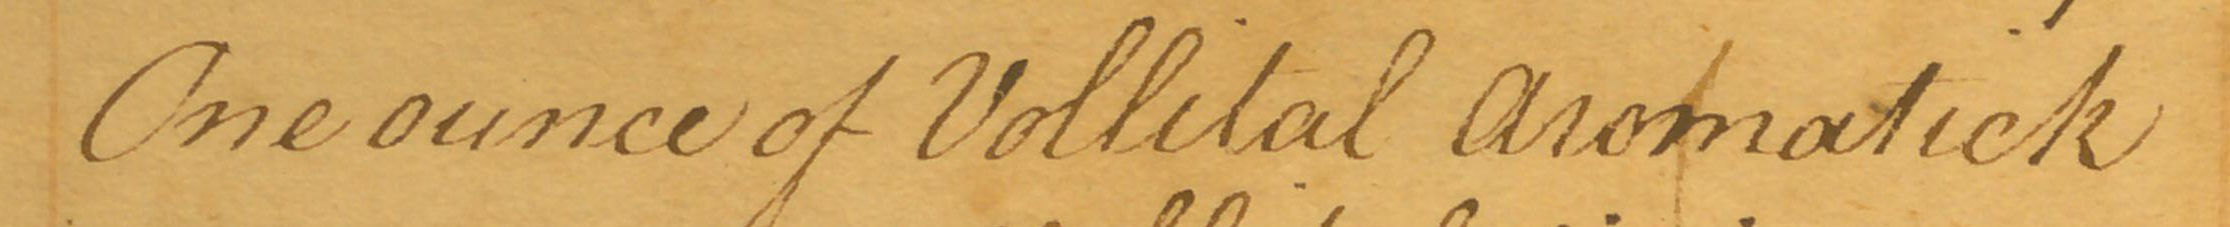One ounce of Vollital Aromatick
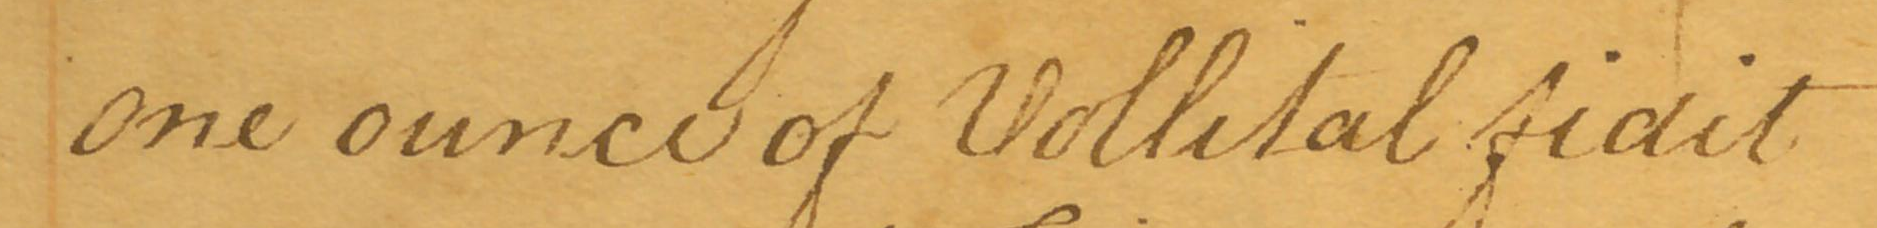one ounce of Vollital fidit
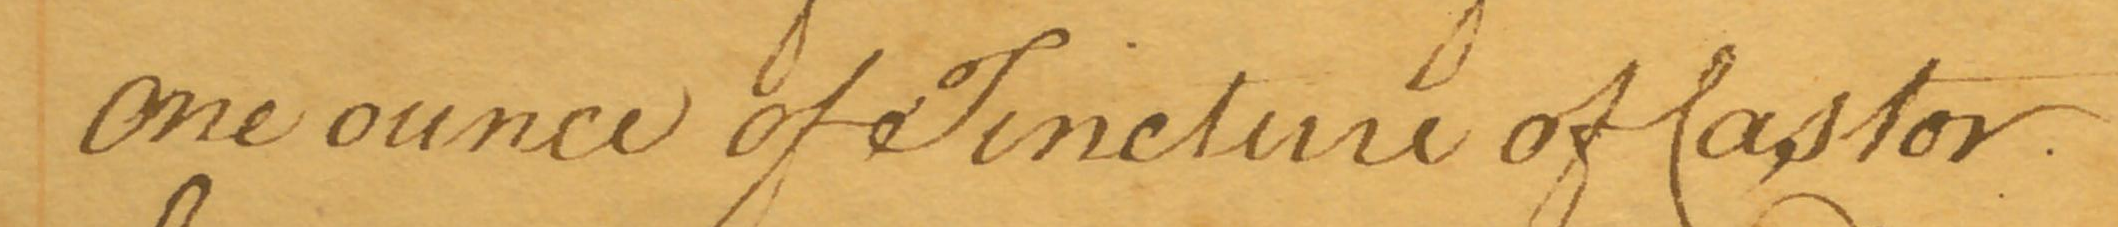one ounce of Tincture of Castor
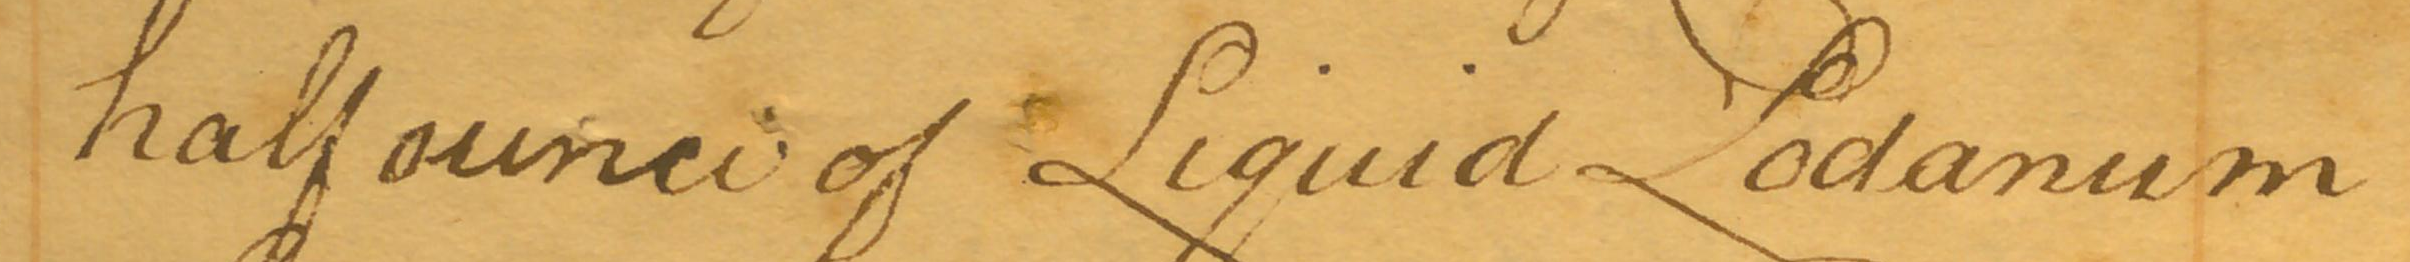half ounce of Liquid Lodanum
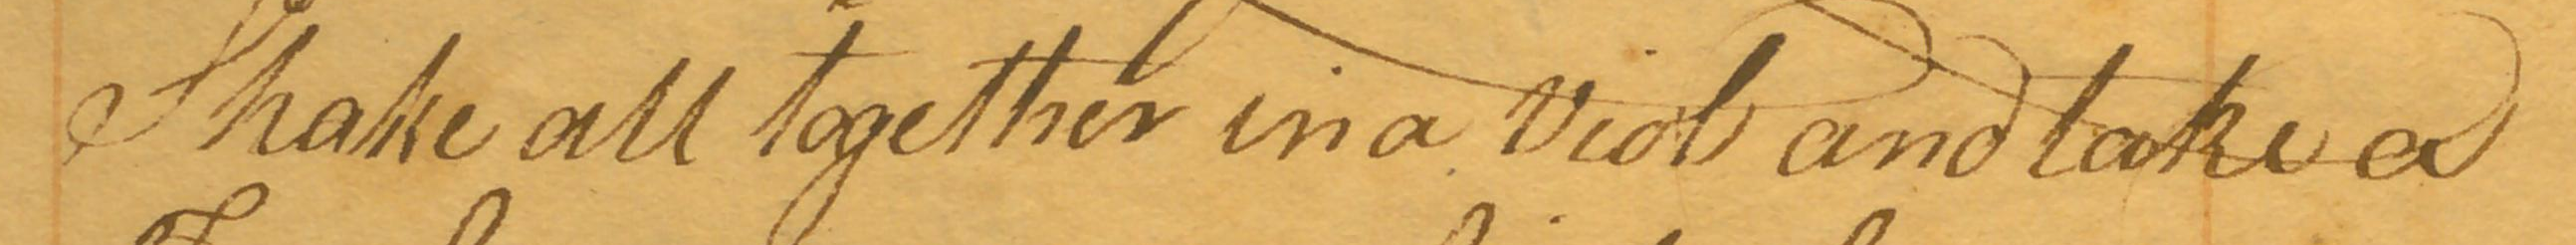Shake all together in a viol and take a
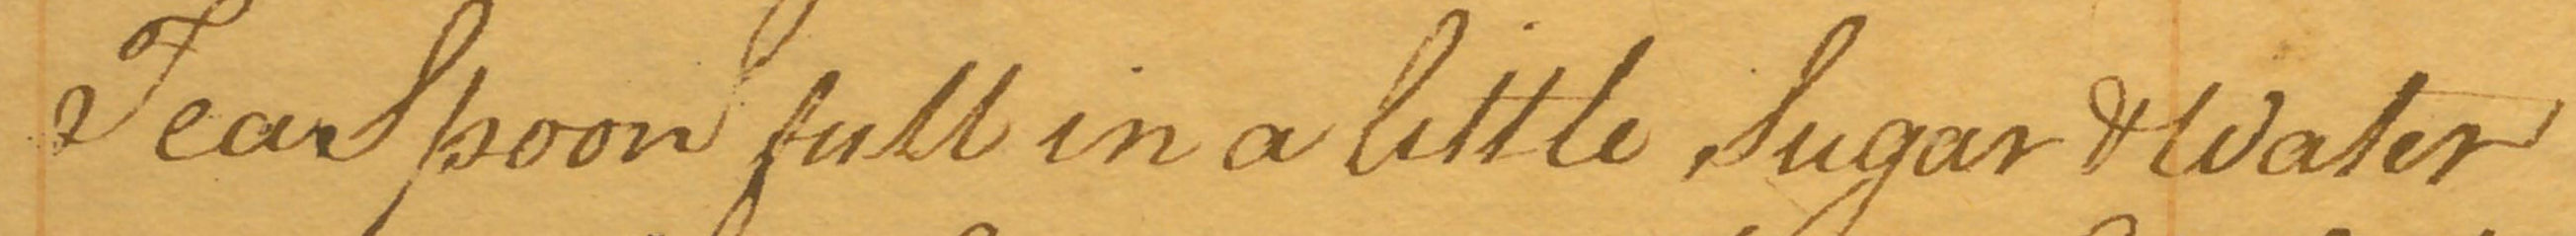Tea Spoon full in a little sugar & Water
